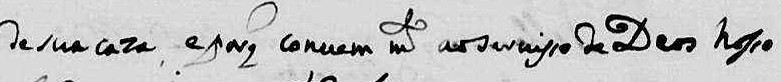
de sua caza, e porq̄ conuem mto ao seruisso de Deos nosso
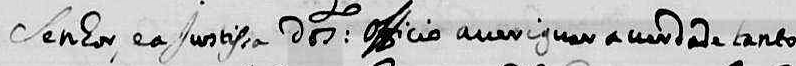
Senhor, e a Justissa do s:to officio aueriguar a uerdade tanto
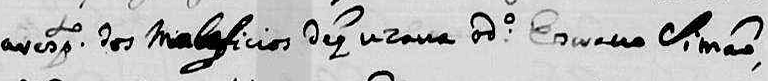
a resp.to dos maleficios de q̄ uzaua o do: Escrauo Simaõ,
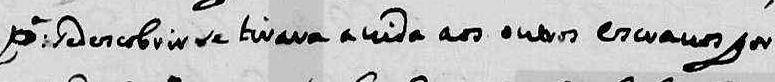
pa: se descobrir se tirava a uida aos outros escrauos por
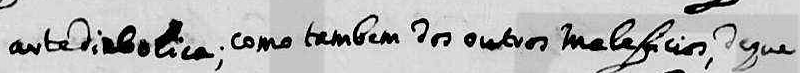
arte diabolica; como tambem dos outros maleficios, de que
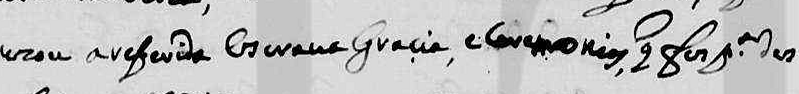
uzou a refferida Escraua Gracia, e ceremonias, q̄ fez p.a des
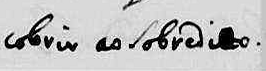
cobrir ao sobredito.
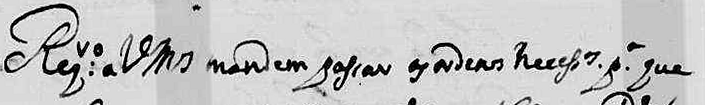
Reqr:o a V Ms mandem passar as ordens necessas. pa. que
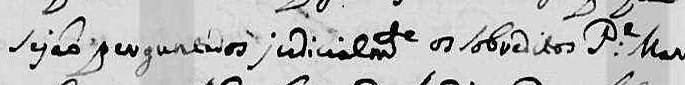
sejaõ perguntados judicialmte os sobreditos P:e Mar
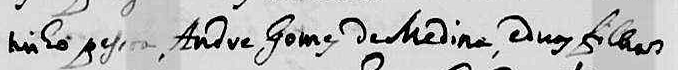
tinho pessoa, Andre Gomes de Medina, e duas filhas
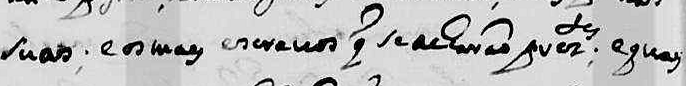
suas; e os maes escrauos q̄ se acharaõ preztes; e quaes
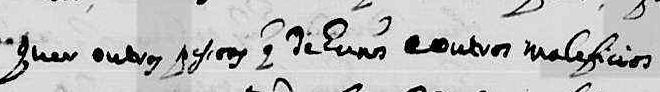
quer outras pessoas q̄ de huns̄ e outros maleficios
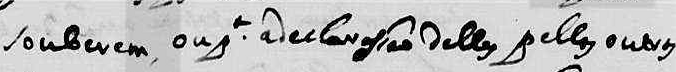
souberem, ou p.a a declarassaõ delles pellos outros
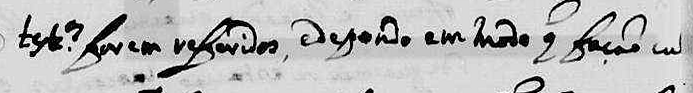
test.os forem referidos, e depondo em tudo q̄ façaõ cul
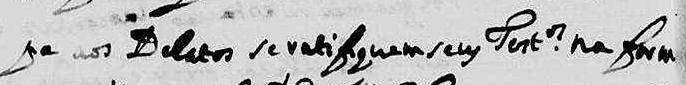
pa aos Delatos se ratifiquem seus Testos. na form
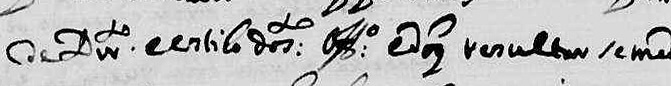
de Dir.to e estilo do s:to off:o e do q̄ resultar se me d
